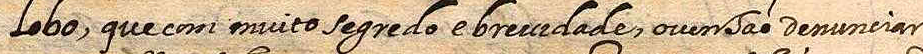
lobo, que com muito segredo e breuidade, o uinhaõ denunciar
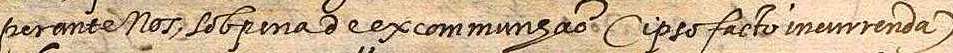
perante nos, sob pena de excommunhaõ (ipso facto incurrenda)
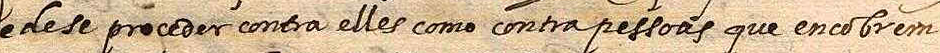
e de se proceder contra elles como contra pessoas que encobrem
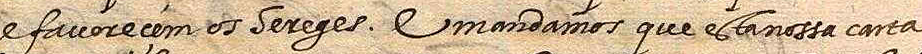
e fauorecem os hereges e mandamos que esta nossa carta
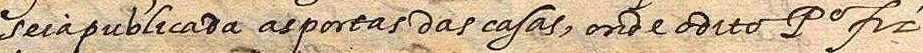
seia publicada as portas das casas, onde o dito Po frz̄
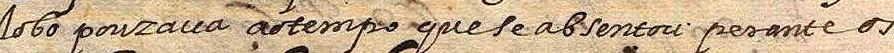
lobo pouzaua ao tempo que se absentou perante os
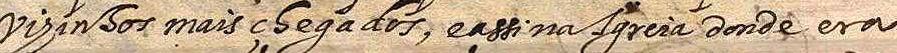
vizinhos mais chegados, e assi na Igreia donde era
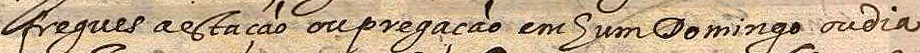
fregues a estaçaõ ou pregação em hum Domingo ou dia
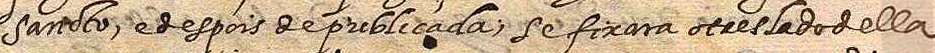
Sancto, e despois de publicada; se fixara o treslado della
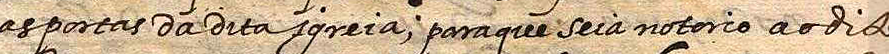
as portas da dita igreia; para que seia notorio ao dicto
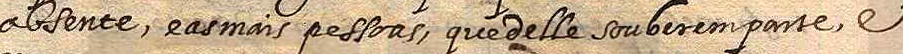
absente, e as mais pessoas, que delle souberem parte, e
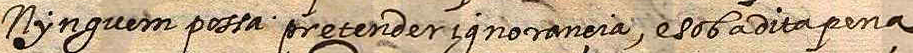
Nynguem possa pretender ignorancia, e sob a dita pena
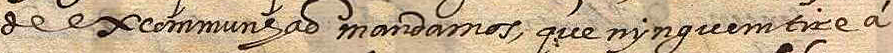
de excommunhaõ mandamos, que nynguem tire á
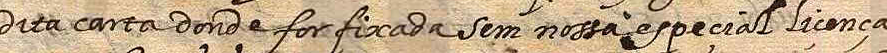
dita carta donde for fixada sem nossa especial licença
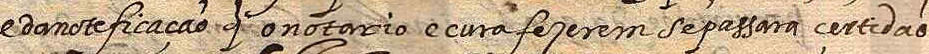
e da noteficaçaõ q̄ o notario e cura fezerem se passara certidaõ
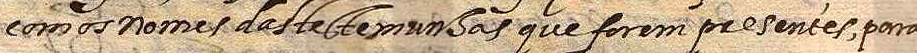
com os nomes das testemunhas que forem presentes, para
